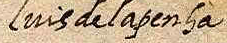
Luis de La penha
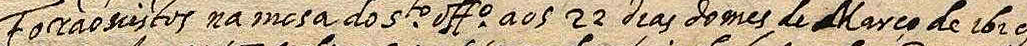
Foraõ vistos na mesa do s.to off.o aos 22 dias do mes de Março de 1619
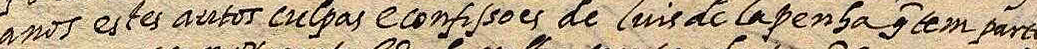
anos estes autos culpas e confissoes de Luis de La penha q̄ tem parte
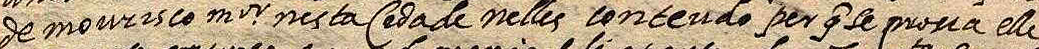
de mourisco m.or nesta Cidade nelles conteudo per q̄ se proua elle
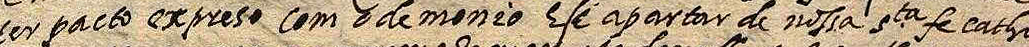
ter pacto expreso com o demonio e se apartar de nossa s.ta fe catho
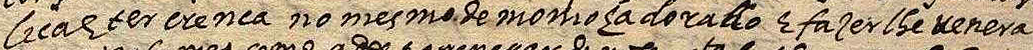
lica e ter crença no mesmo demonio e adorallo e fazerlhe uenera
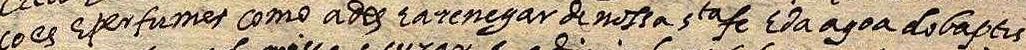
çoes e perfumes como a des E a renegar de nossa s.ta fe e da agoa do baptis
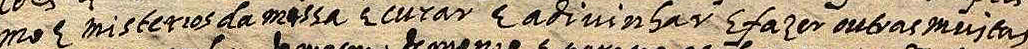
mo e misterios da missa e curar e adiuinhar e fazer outras muitas
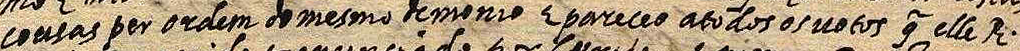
cousas per ordem do mesmo demonio e pareceo a todos os uotos q̄ elle R.
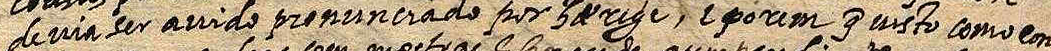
devia ser avido pronunciado por herege, e porem q̄ visto como con
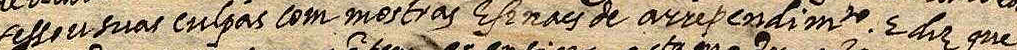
fessou suas culpas com mostras e sinaes de arrependim.to e diz que
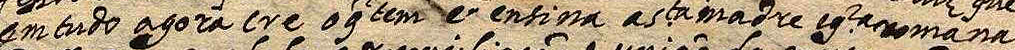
em tudo agora cre o q̄ tem e ensina a s.ta madre eg.ra romana na
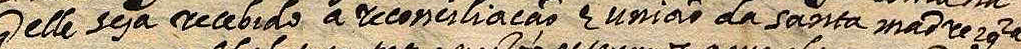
q̄ elle seja recebido a reconciliação e uniaõ da santa madre ig.ra
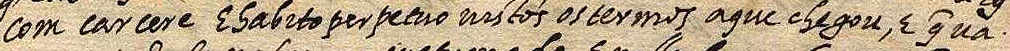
com carcere e habito perpetuo vistos os termos a que chegou, e q̄ va
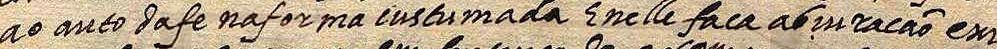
ao auto da fe na forma custumada e nelle faca abiuracaõ em
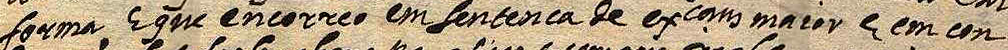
forma E que encorreo em Sentenca de ex.com maior e em con
